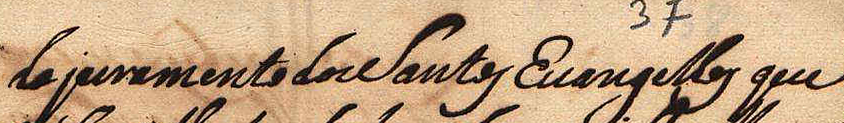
do juramento dos Santos Euangelhos que
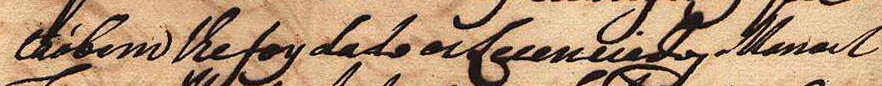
taõbem lhe foy dado os Lecenciados Manoel
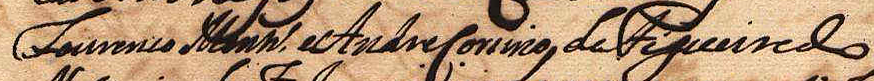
Lourenço Montr.o e Andre Corsino, de Figueiredo
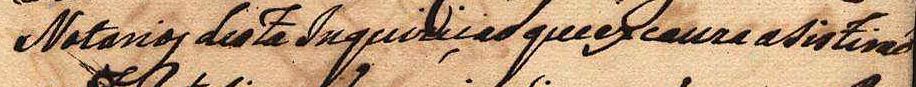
Notarios desta Inquiziçaõ que ex cauza asistiraõ
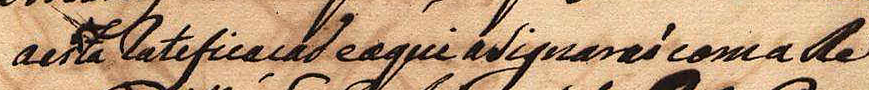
a esta Rateficaçaõ, e aqui asignaraõ com a Re
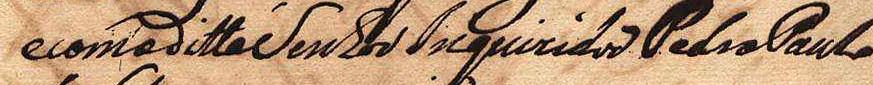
e com o ditto Senhor Inquizidor Pedro Paulo
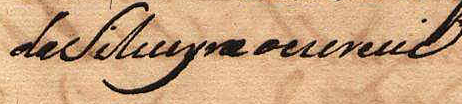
da Silueyra o escreui
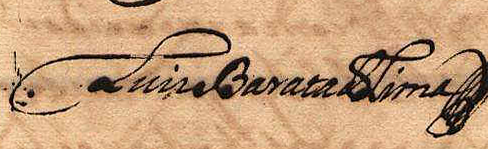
Luiz Barata d̄ lima
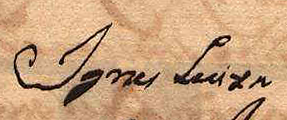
Ignes Luiza
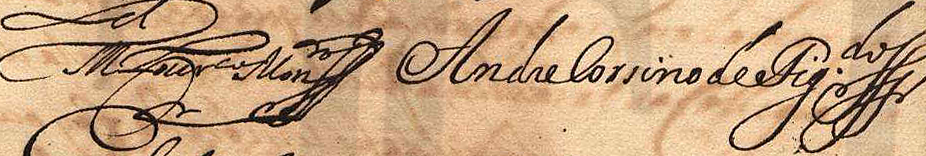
Mel Lourco Montro Andre Corsino de Fig.do
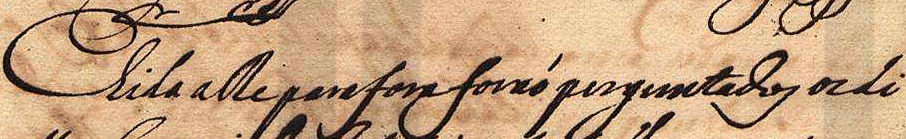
E hida a Re para fora foraõ perguntados os di
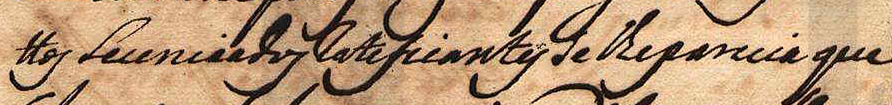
ttos Lecenciados Ratificantes se lhe parecia que
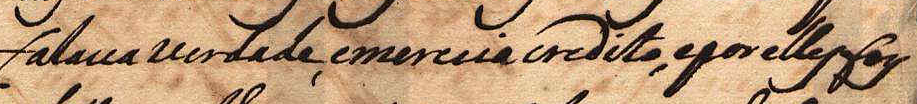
falaua verdade, e merecia credito, e por elles foy
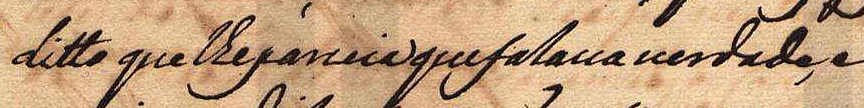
ditto que lhe parecia que falaua uerdade, e
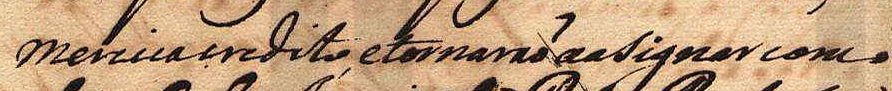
merecia credito, e tornaraõ a asignar com o
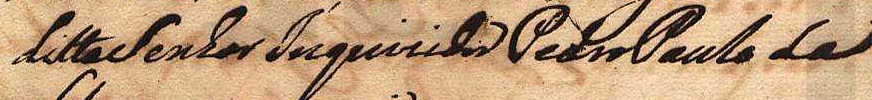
ditto Senhor Inquizidor Pedro Paulo da
